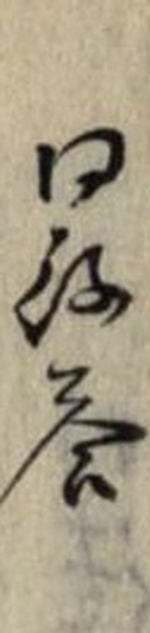同役答
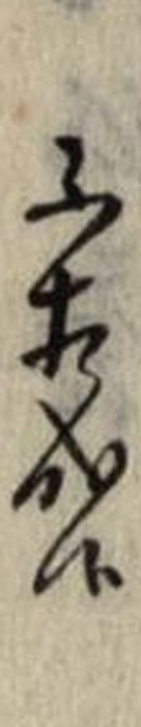不相成候
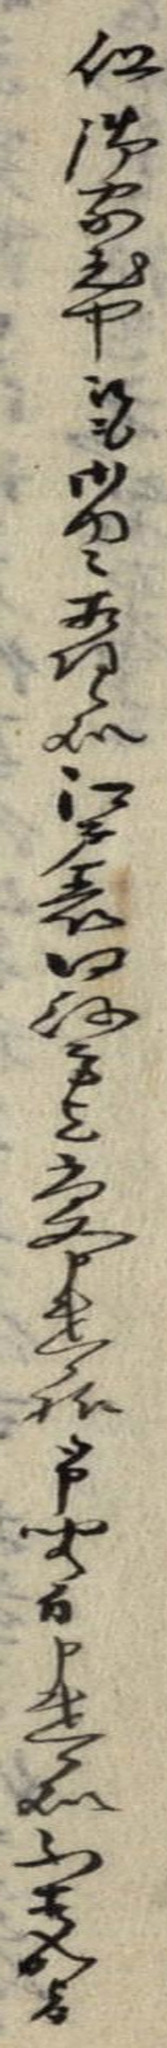但御家老中江も御内々相伺候処江戸表同役方迄尚又申遣候様被申聞候ニ付申遣候処不相成旨

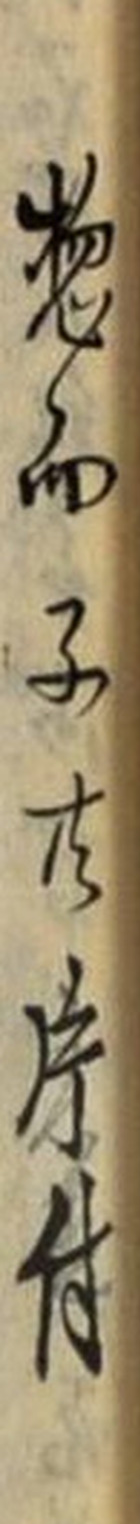惣而子共片付
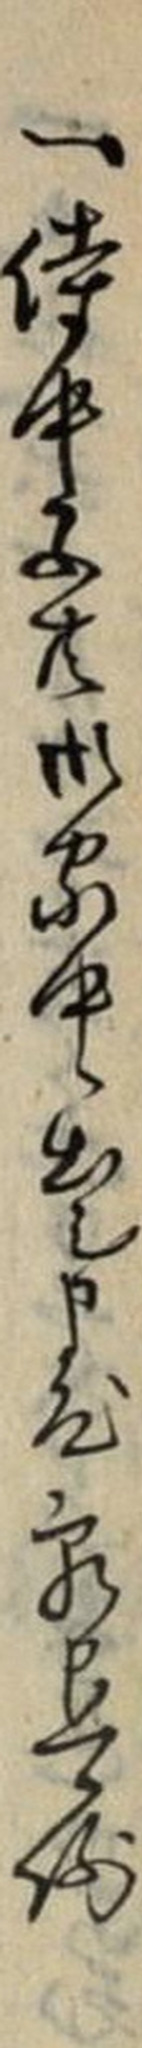一侍中子共御家中へ出シ申度願申上候例
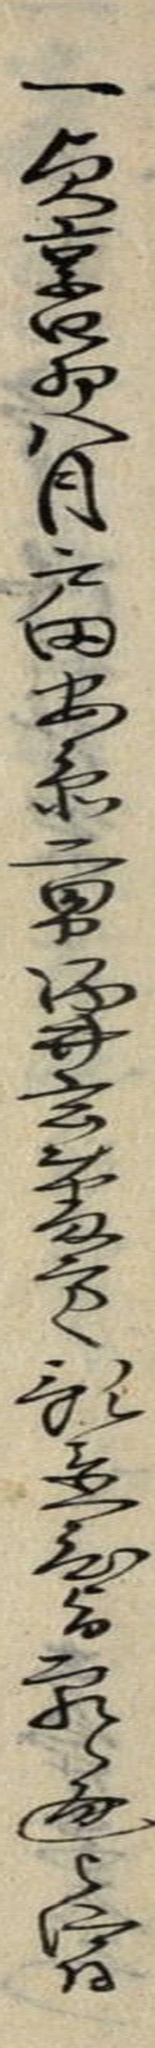一貞享四卯八月戸田安兵衛二男酒井玄蕃方へ預置度旨願之通被仰付
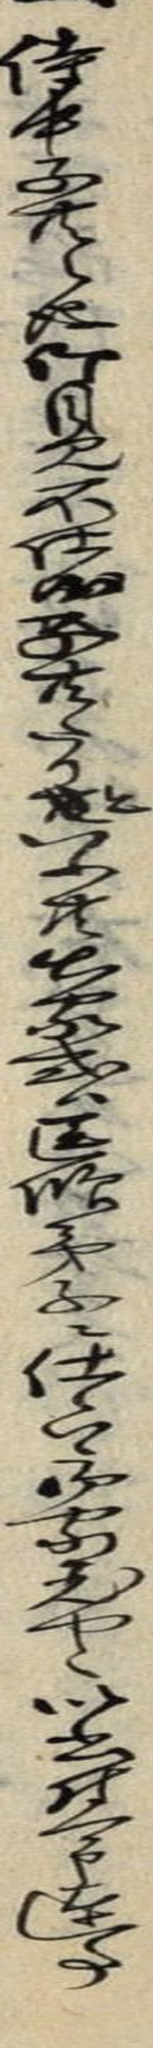一侍中子共之儀御目見不仕子共たりといふ共出家或ハ医師弟子ニ仕候ハヽ御家老中へ御書付可申達候事
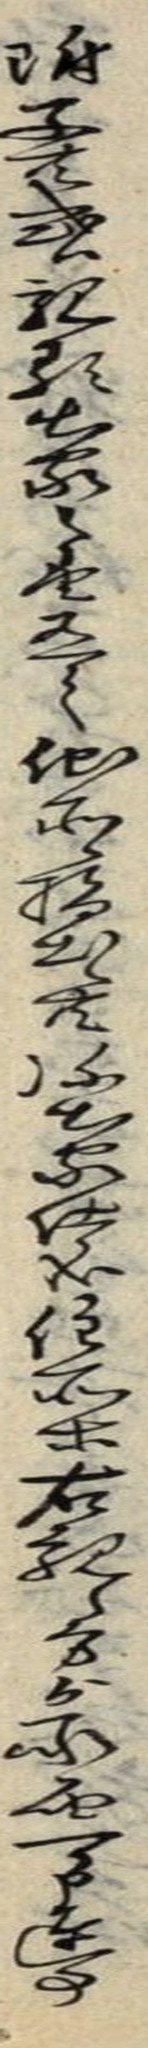附子共或ハ親類出家之望有之他所へ指出候共弥出家仕候哉住所等右親之方ゟ承届可申達事
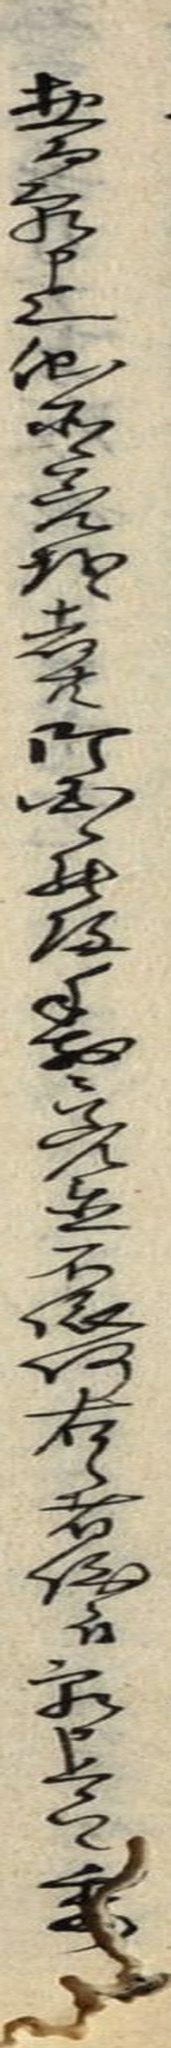惣而願申上他所ヘ差越候者共御国へ罷帰手前ニ差置不依何右之者儀ニ付願申上候ハヽ委
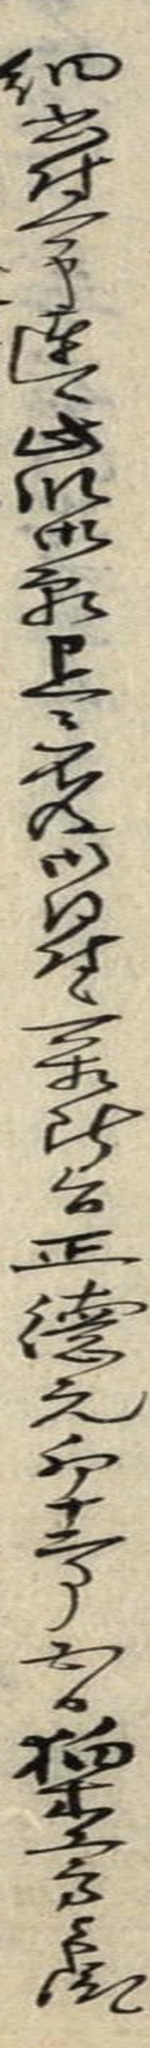細書付可申達候此段御願申上ニ不及御目付へ相断旨正徳元卯十二月五日狛木工方被申渡候
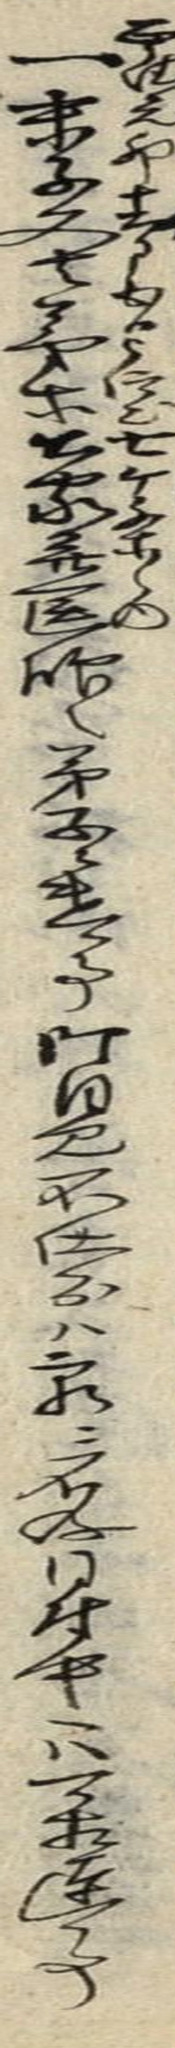一末子又者弟等出家并医師之弟子ニ遣候事御目見不仕分ハ願ニ不及目付中ヘハ可相達事
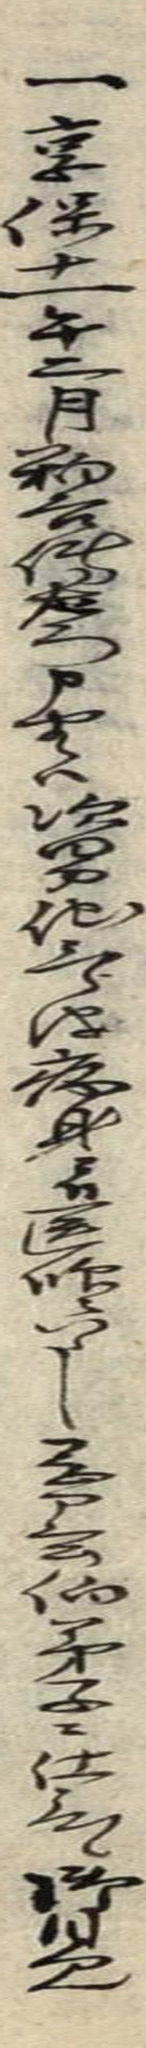一享保十一午二月粕谷伝左衛門申聞候ハ次男他三郎儀病身ニ付医師ニいたし岡部玄伯弟子ニ仕度候御目見
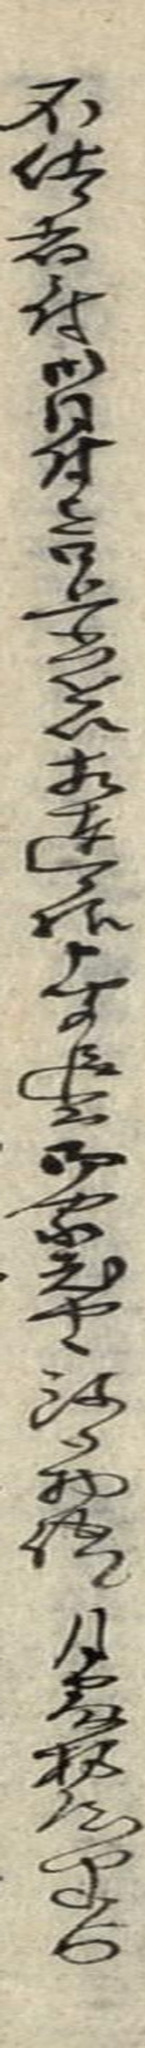不仕候者ニ付御目付迄口上書を以相達候様申聞追而御家老中ヘ致御物語候月番栃屋半右衛門
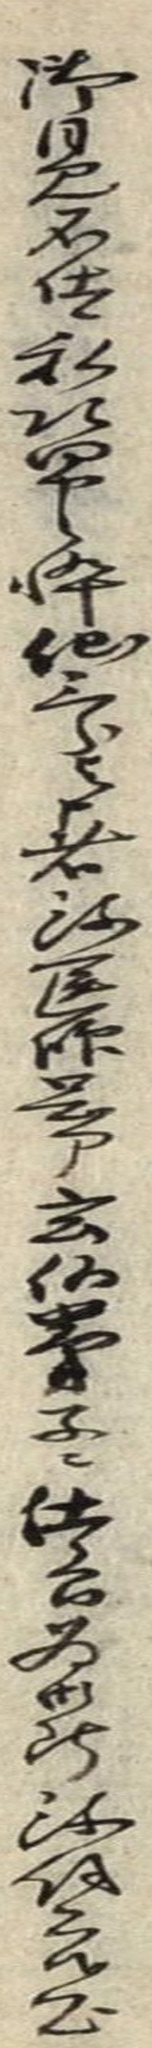御目見不仕候私次男之倅他三郎と申者致医師岡部玄伯養子ニ仕候間為御断致伺之候以上
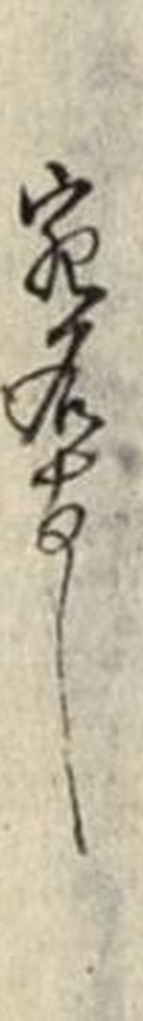宛名なし
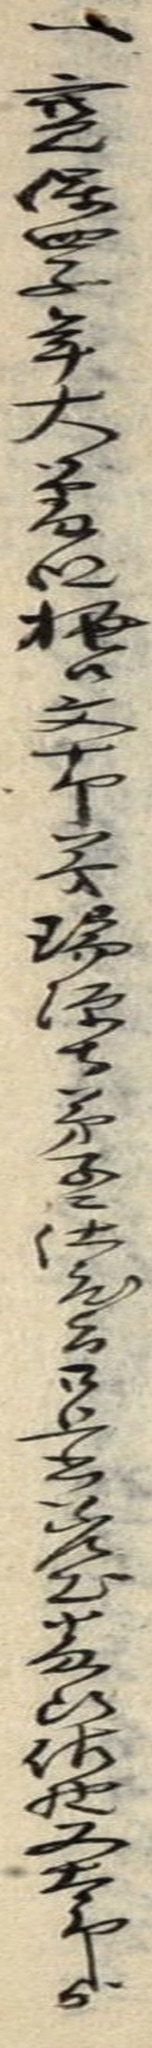一寛保四子年大御番組樋口文十郎弟瑞源寺弟子ニ仕度旨口上書差出番頭佐野又太郎ゟ
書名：養子縁組之部
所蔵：福井県文書館 Fukui Prefectural Archives
